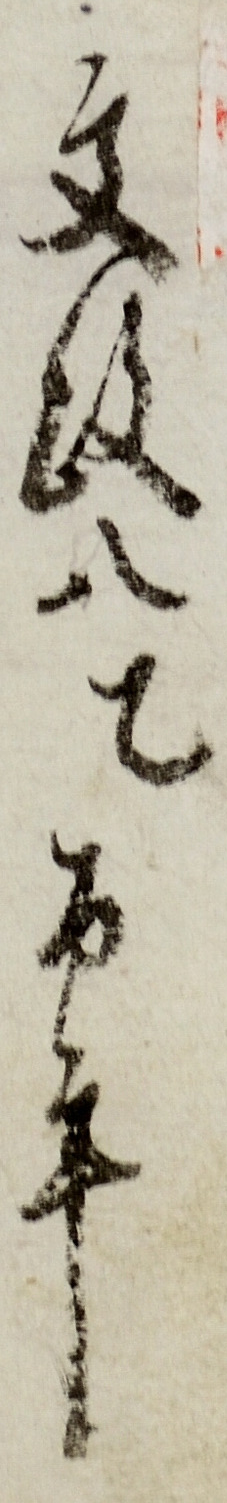文政八乙酉年
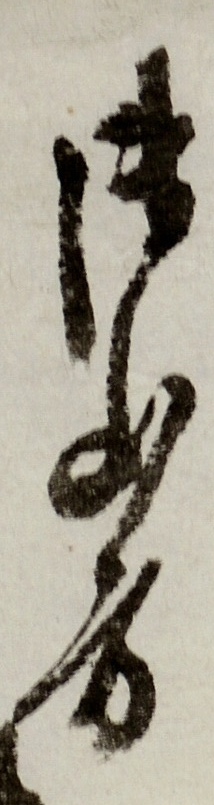御山方
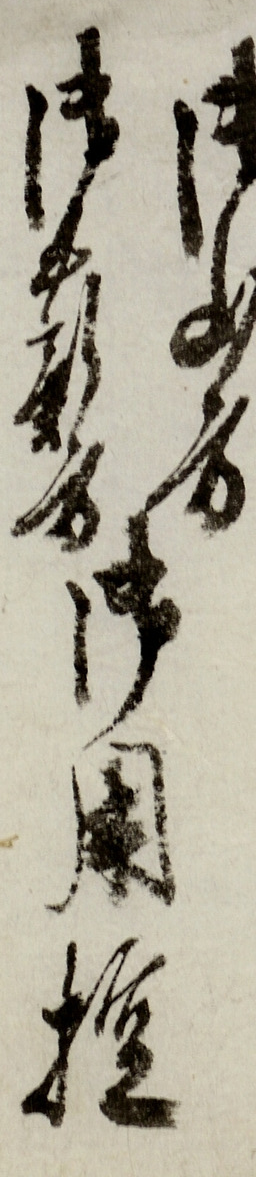御薪方御用控
